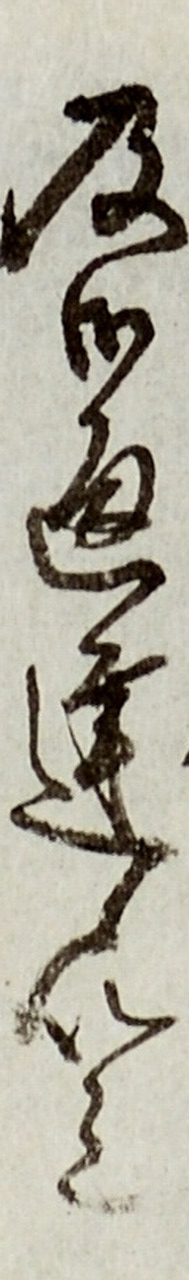及御通達候以上
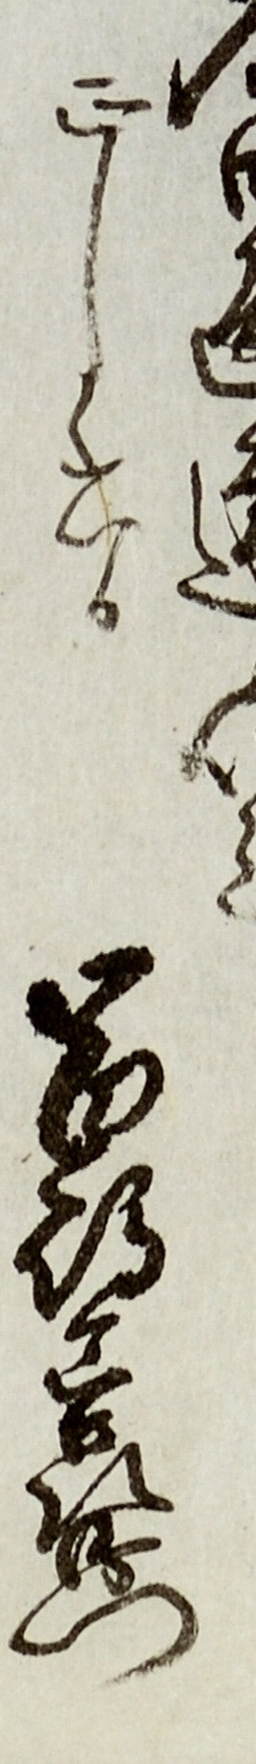正月六日冨嶋善左衛門
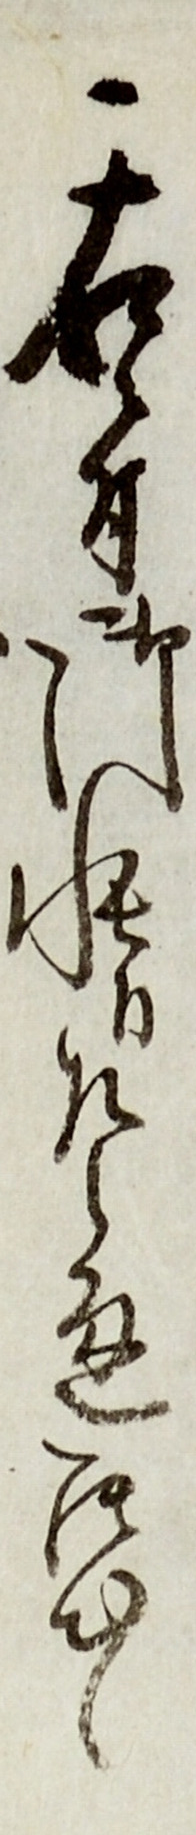一右ニ付御帳江左之通罷出候
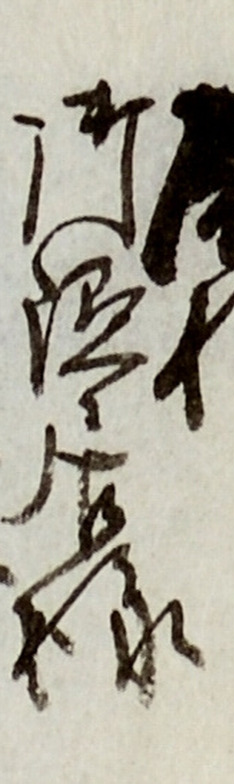御隠居様
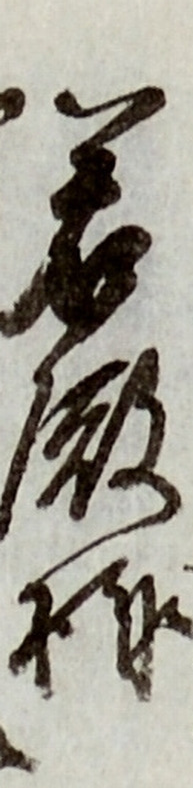若殿様
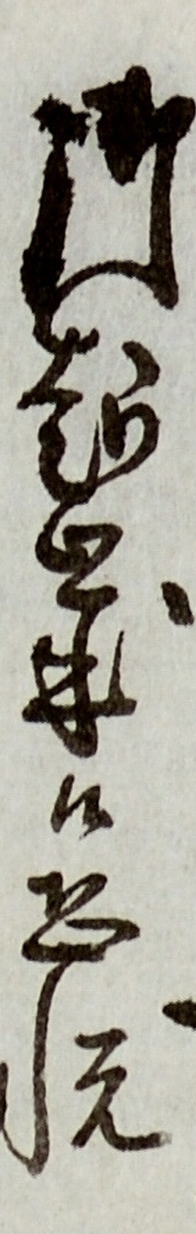御超歳候恐悦
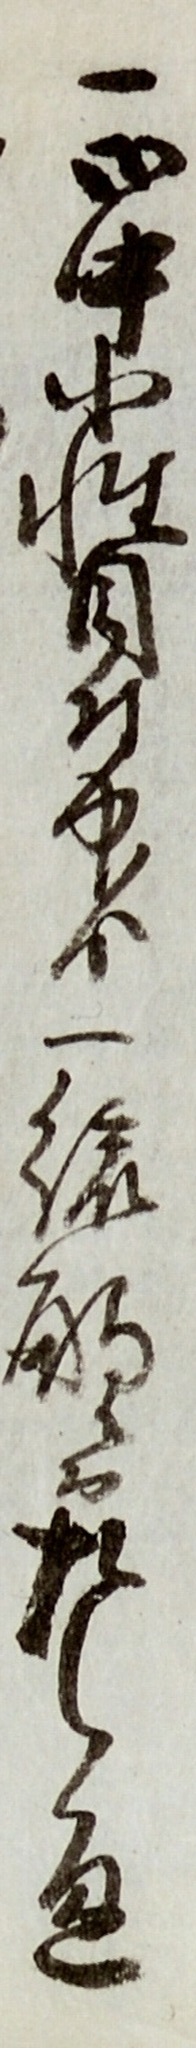一御中小性目付中ゟ一統触ニ而左之通
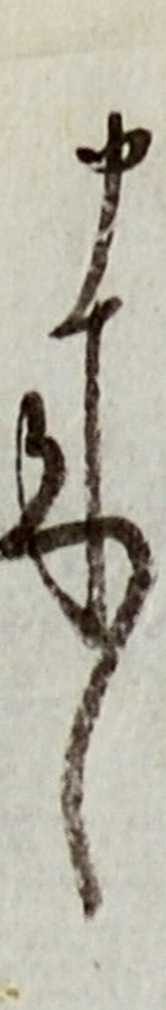申来候
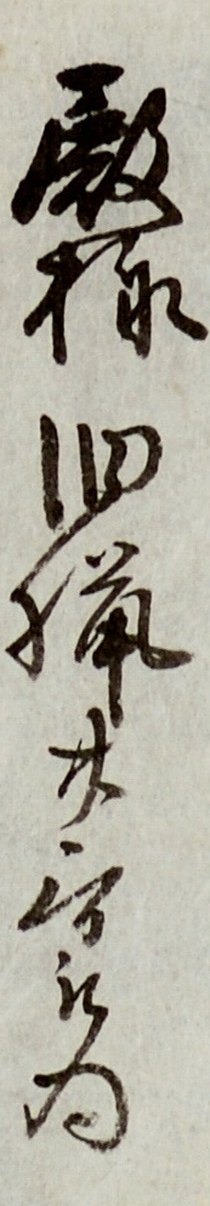殿様旧猟廿三日被為

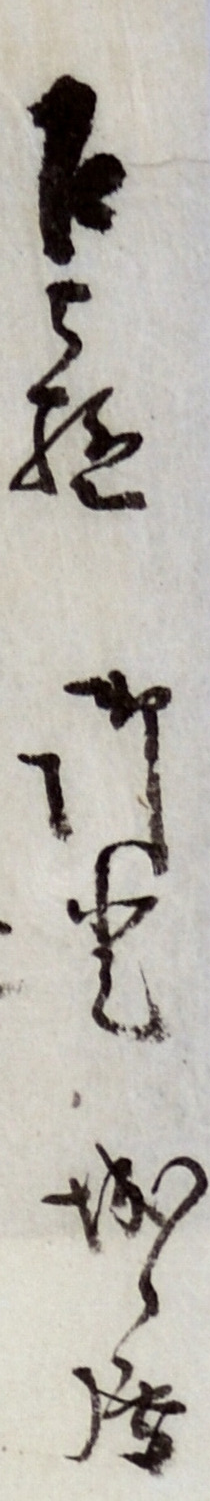召被遊御登城候処
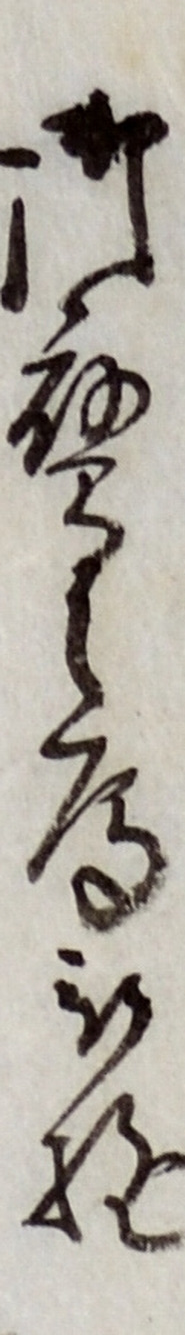御鷹之鳥被遊
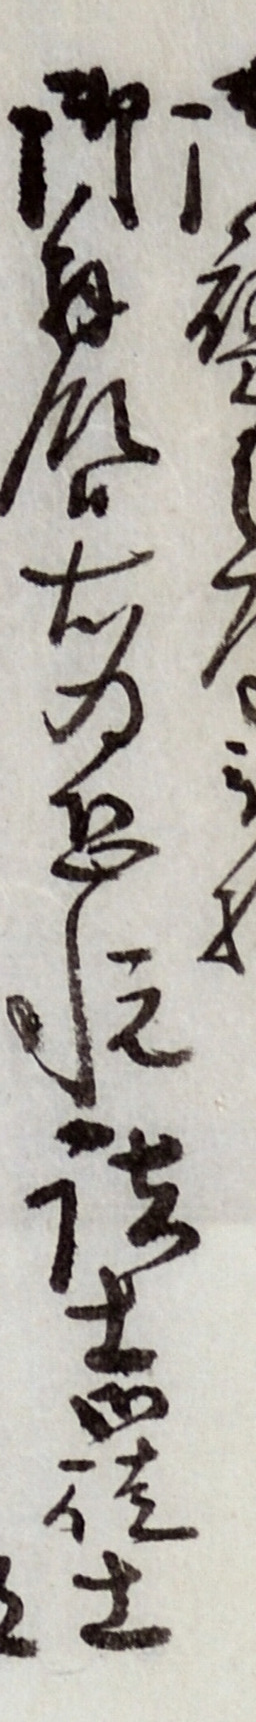御拝領候右為恐悦諸士御徒士
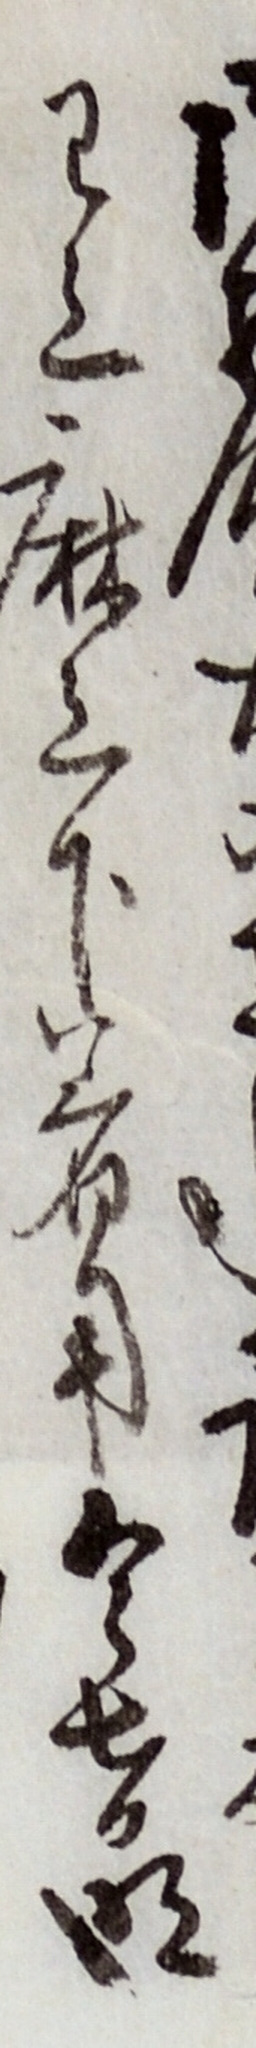已上麻上下着用今七日明
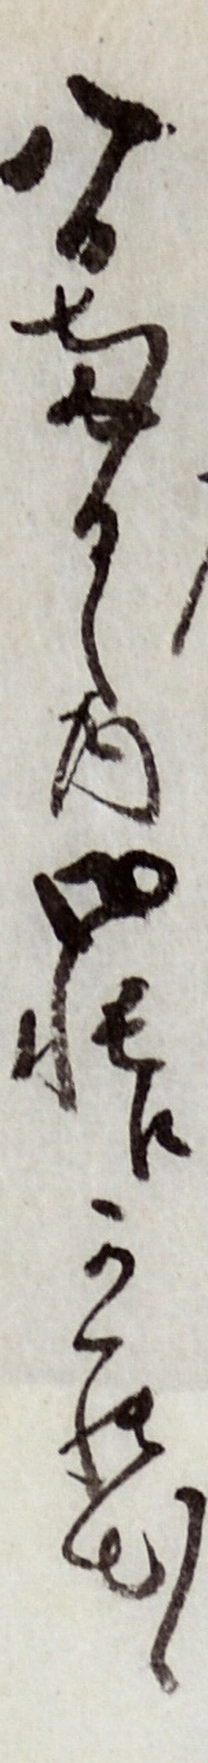八日両日之内御帳江可罷出候
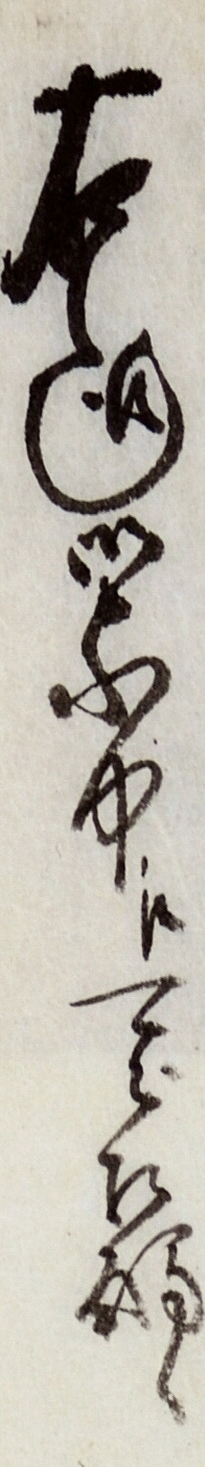右之趣御家中江可被相触候
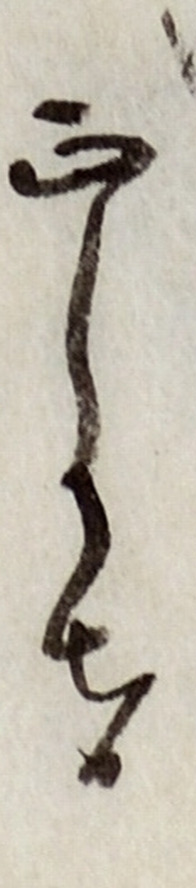正月七日
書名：御山方御薪方諸事御用留
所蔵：伊那市立高遠町図書館・合同会社AMANE
